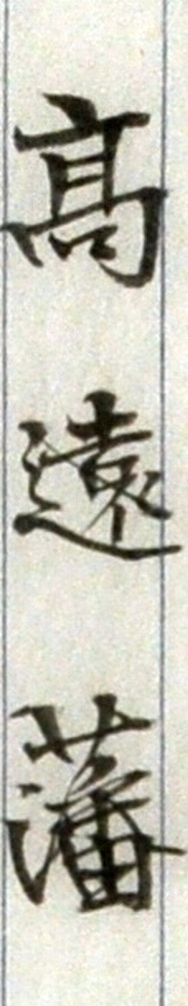高遠藩
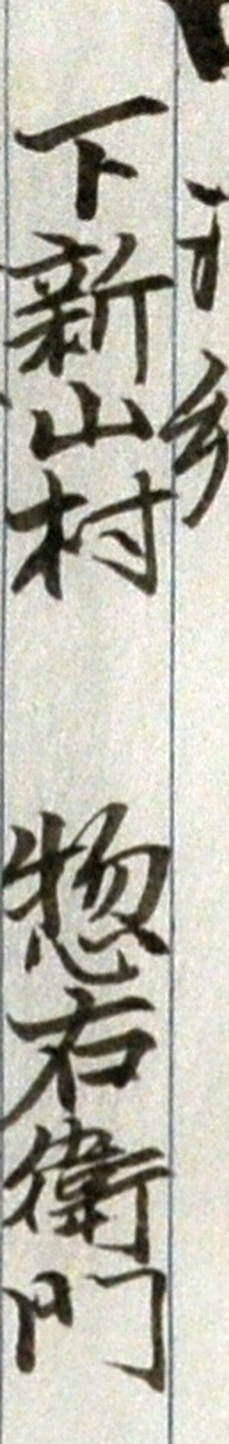下新山村惣右衛門
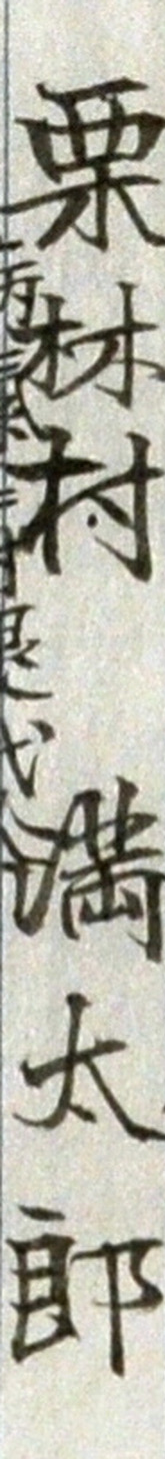栗林村満太郎
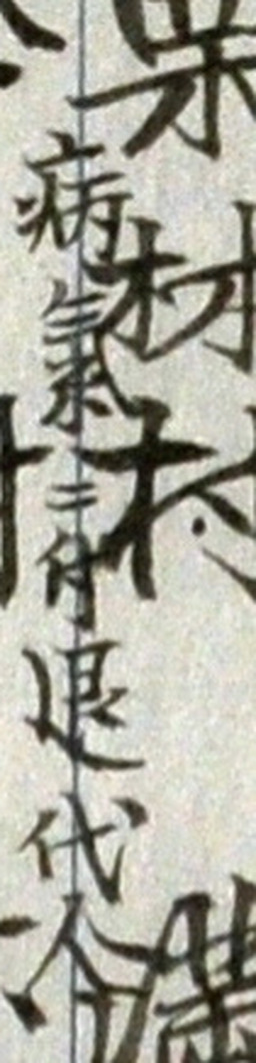病気ニ付退代人
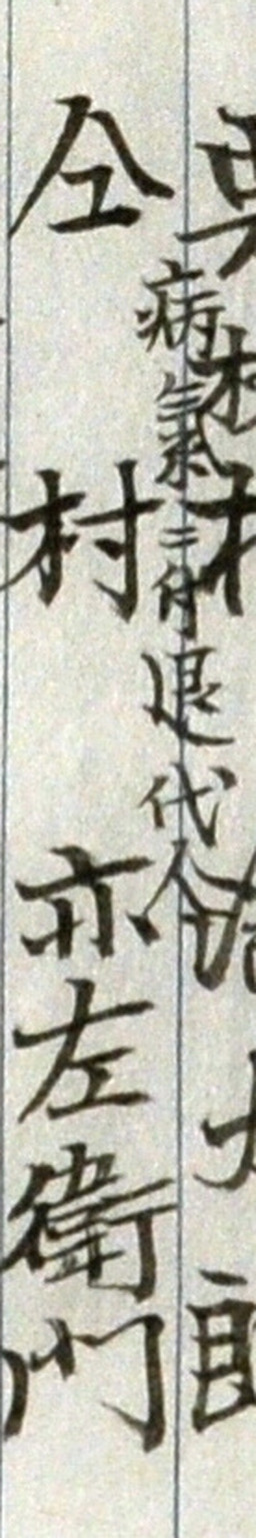同村亦左衛門
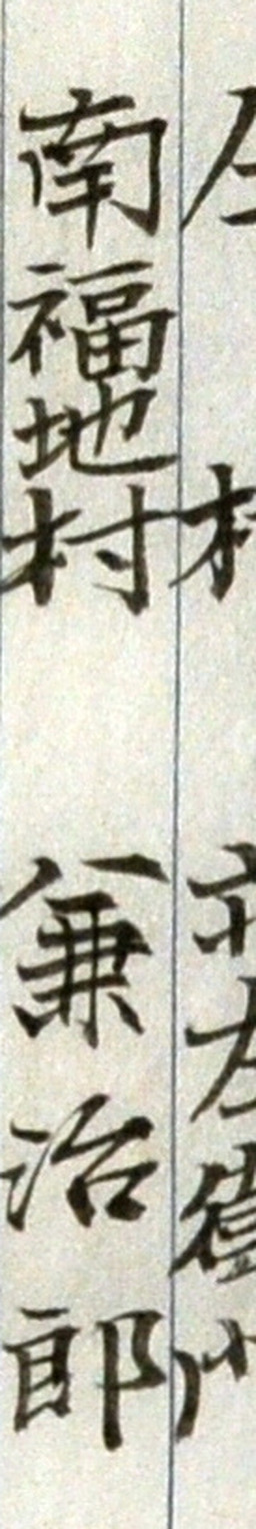南福地村兼治郎
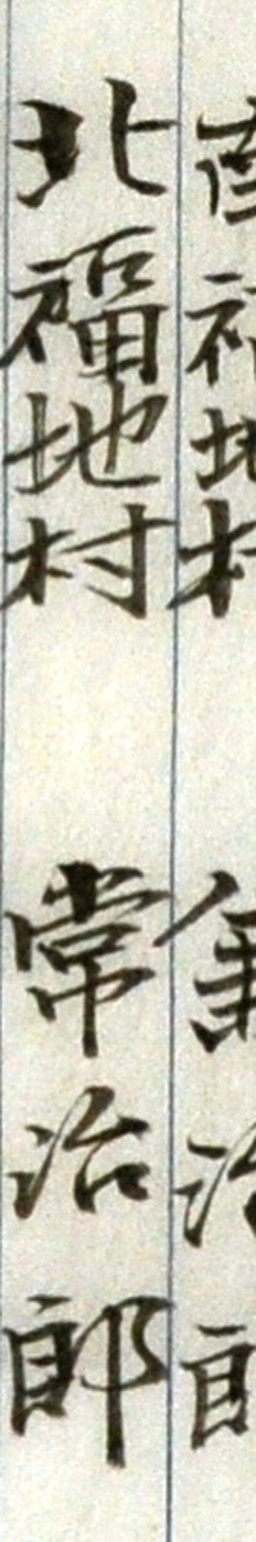北福地村常治郎
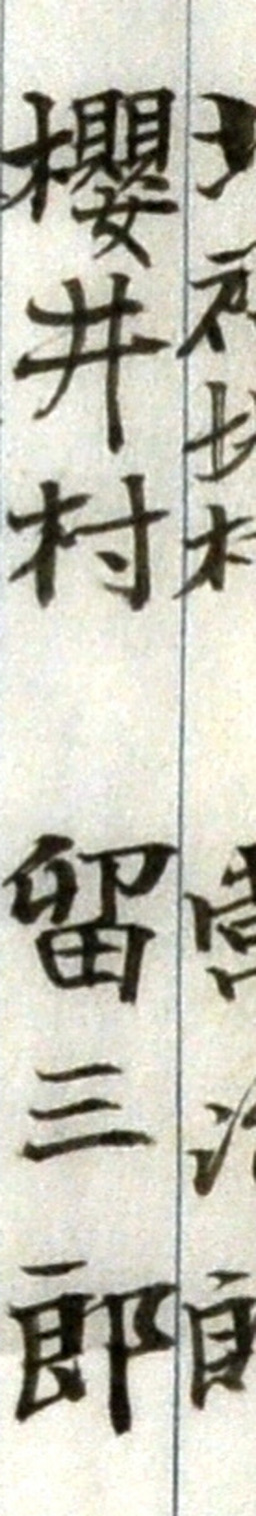桜井村留三郎
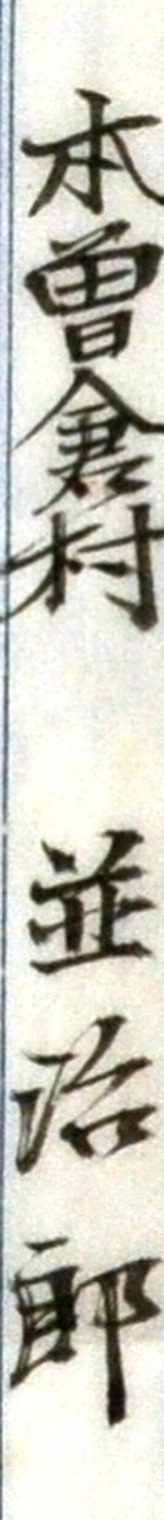本曽倉村並治郎
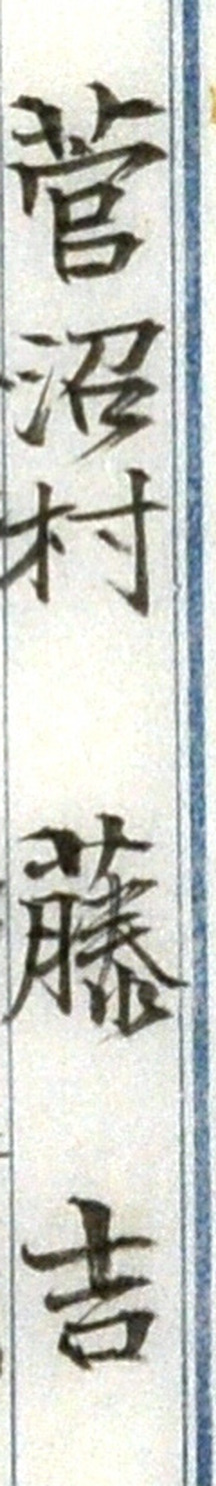菅沼村藤吉
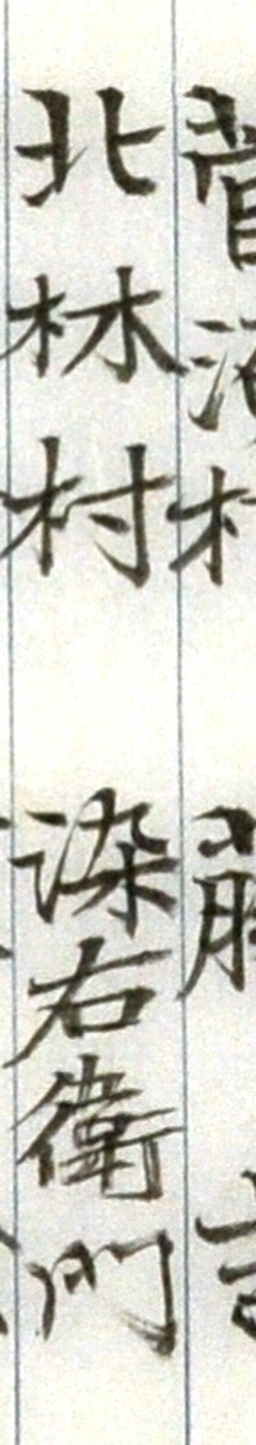北林村染右衛門
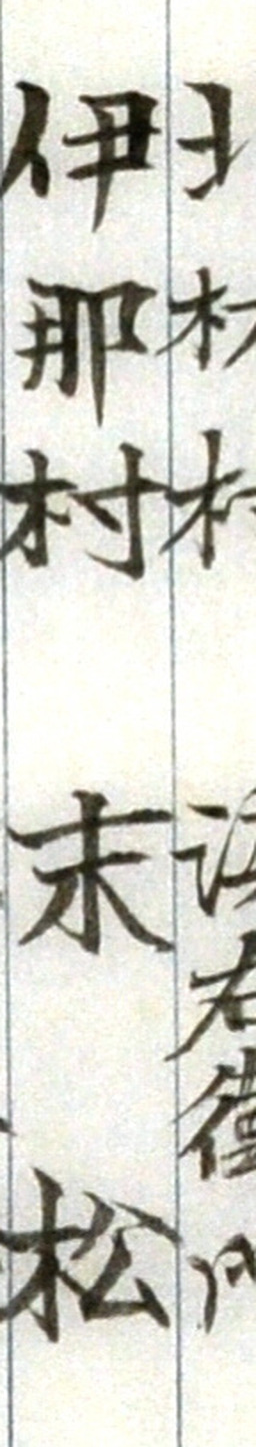伊那村末松
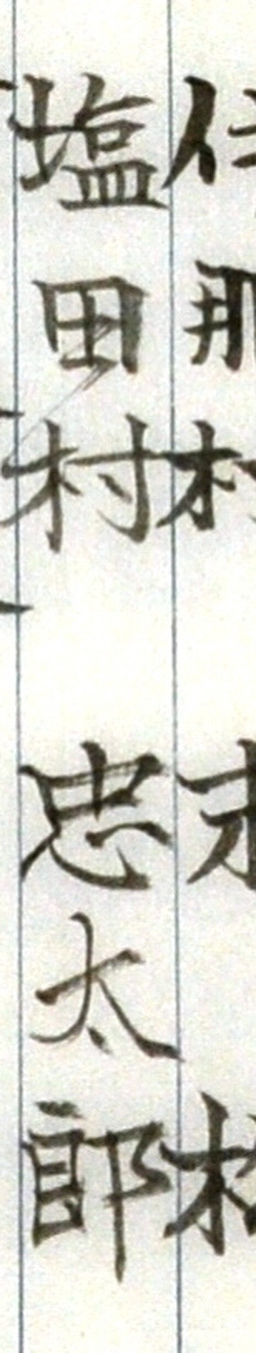塩田村忠太郎
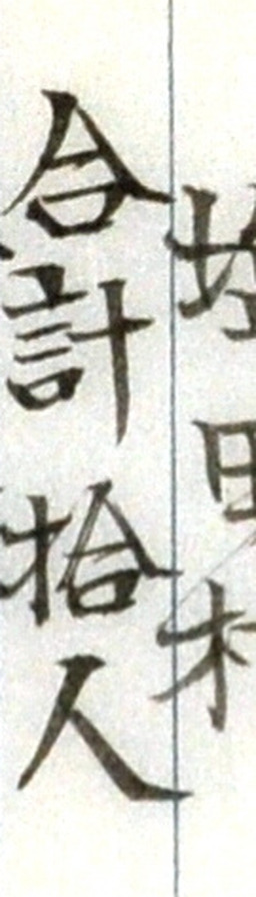合計拾人
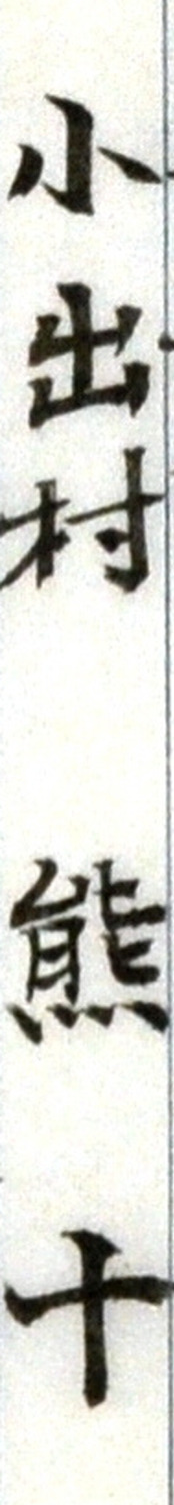小出村熊十
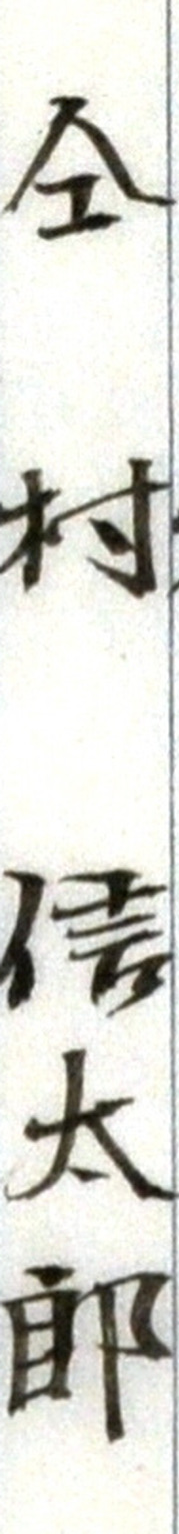同村信太郎
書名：高遠藩兵員名簿歩兵銃隊・郷村募集員
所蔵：伊那市立高遠町図書館・合同会社AMANE
